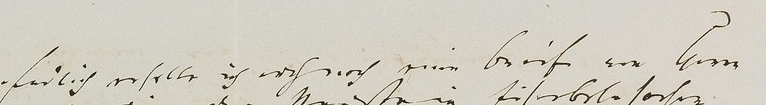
Endlich erhalte ich auch noch einen Brief von Herrn
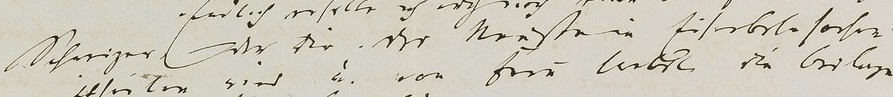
Schweizer, der Dir das Neuste in Eisenbahnsachen
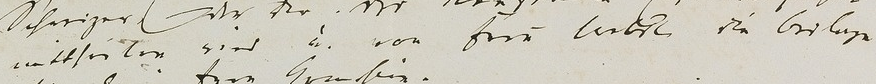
mittheilen wird u. von Frau Uebel, die Beilage
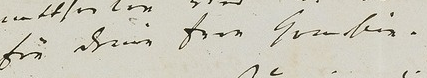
für deine Frau Gemahlin.
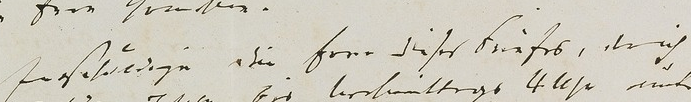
Entschuldige die Form dieses Briefes, den ich
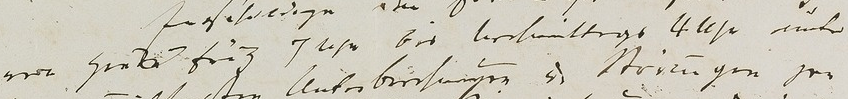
von heute früh 7 Uhr bis Nachmittags 4 Uhr unter
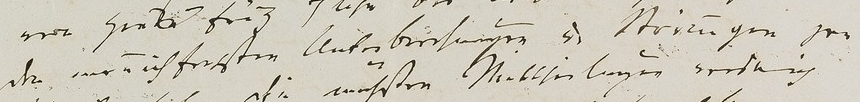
den mannichfachsten Unterbrechungen u. Störungen ge-
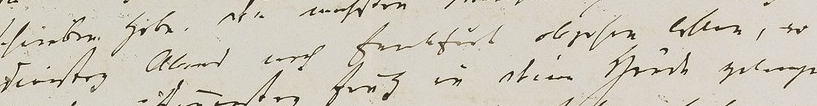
Dienstag Abend nach Frankfurt abgehen lassen, wo
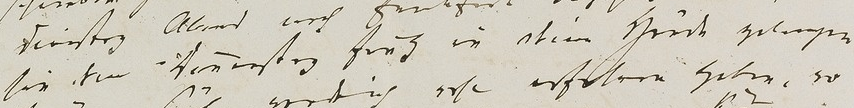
sie denn Donnerstag früh in deine Hände gelangen
